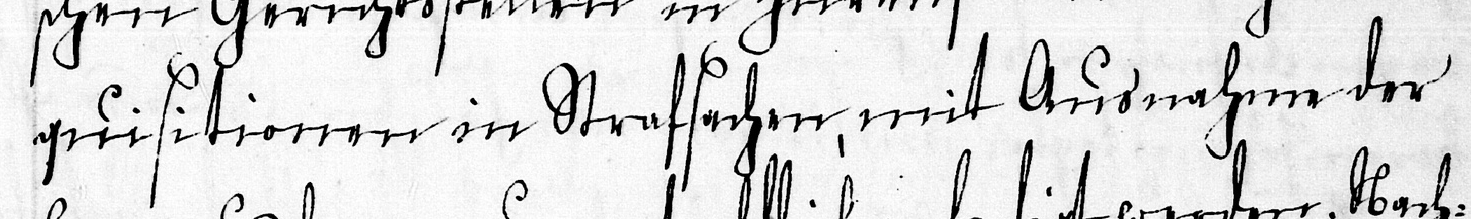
quisitionen in Strafsachen, mit Ausnahme der
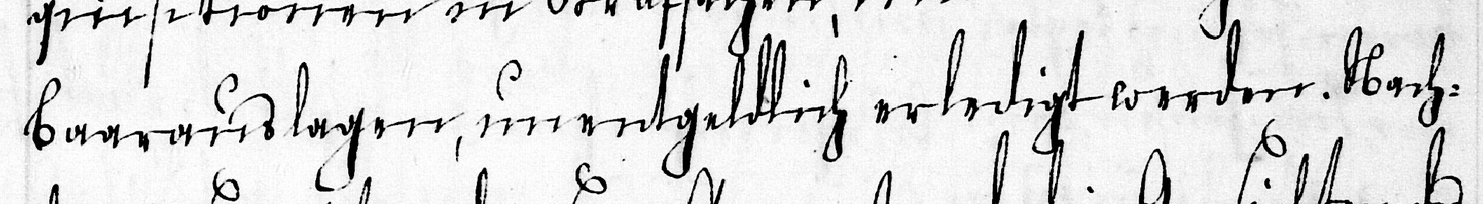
Baarauslagen, unentgeldlich erledigt werden. Nach¬
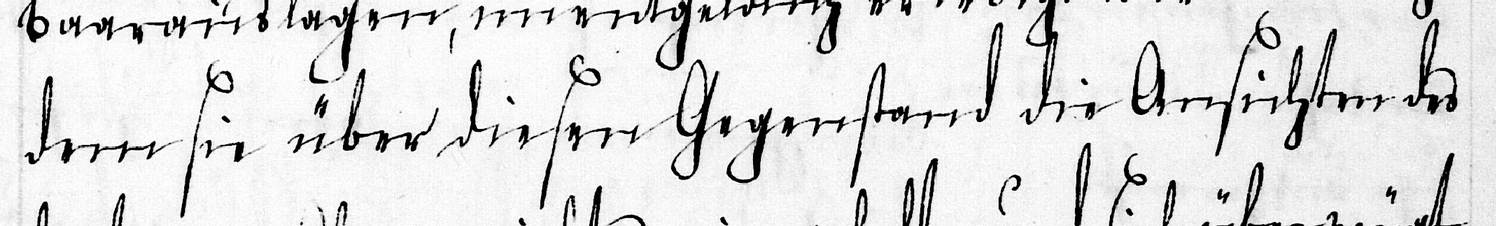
dem sie über diesen Gegenstand die Ansichten des
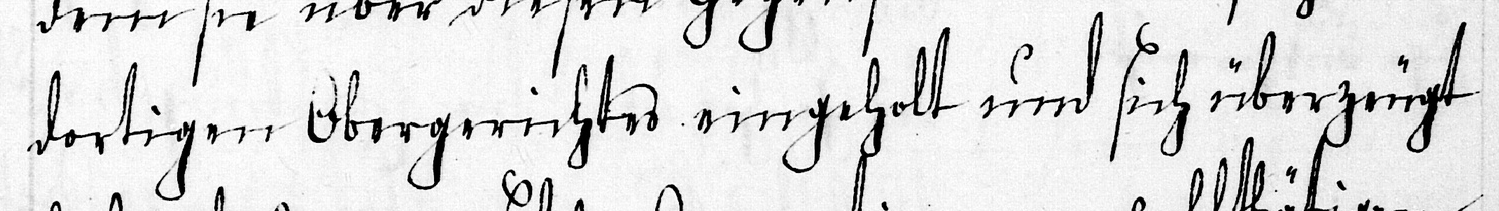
dortigen Obergerichtes eingeholt und sich überzeugt
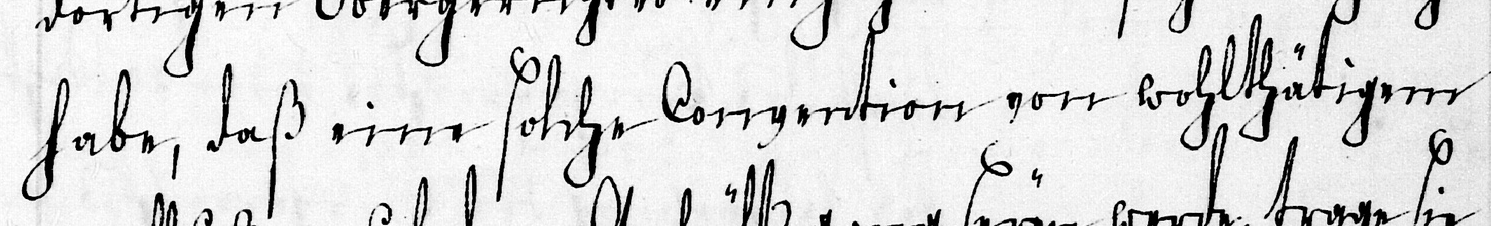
habe, daß eine solche Convention von wohlthätigem
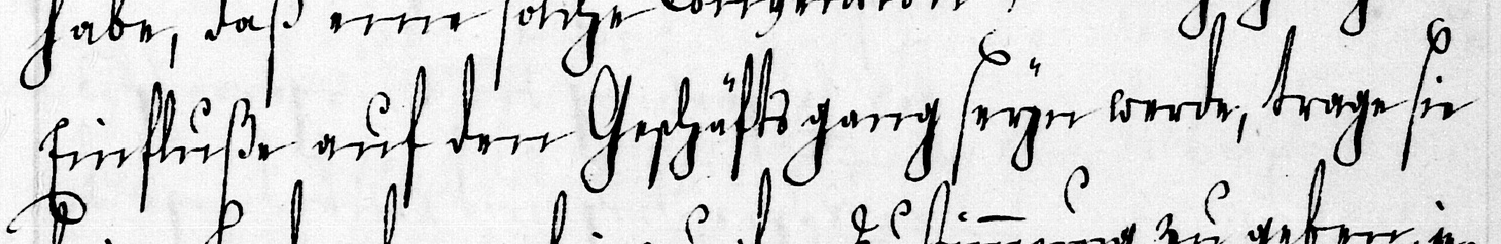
Einfluße auf den Geschäftsgang seyn werde, trage sie
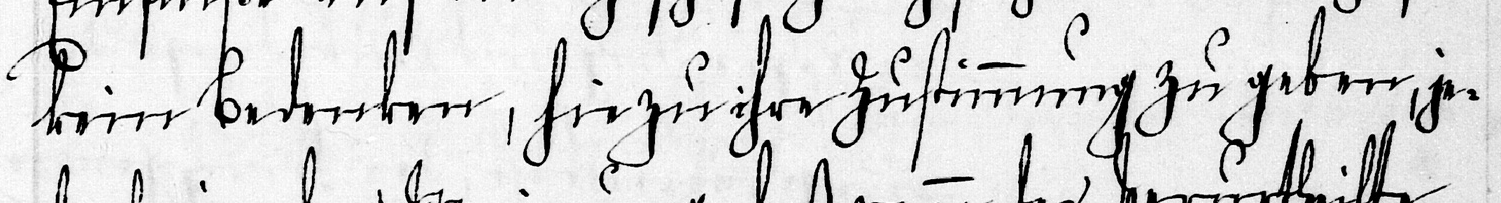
kein Bedenken, hiezu ihre Zustimmung zu geben, je¬
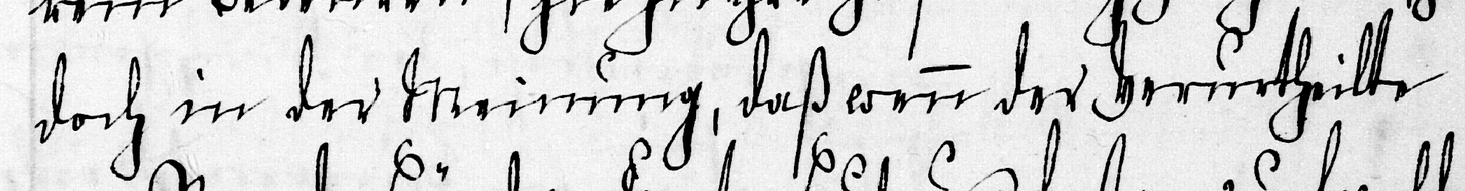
doch in der Meinung, daß wenn der Verurtheilte
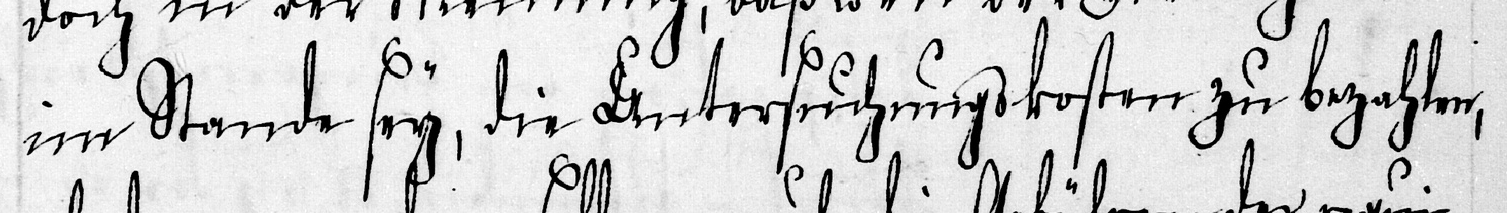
im Stande sey, die Untersuchungskosten zu bezahlen,
